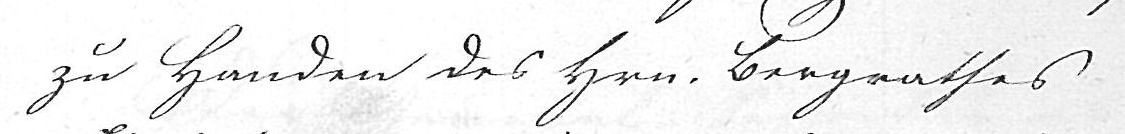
zu Handen des Hrn. Bergrathes
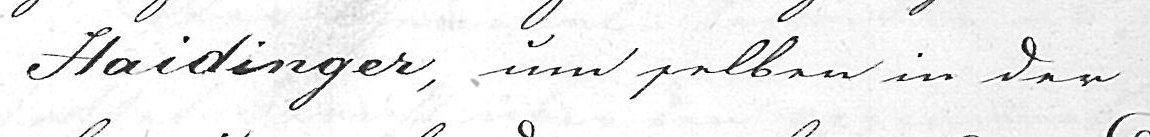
Haidinger, um selben in der
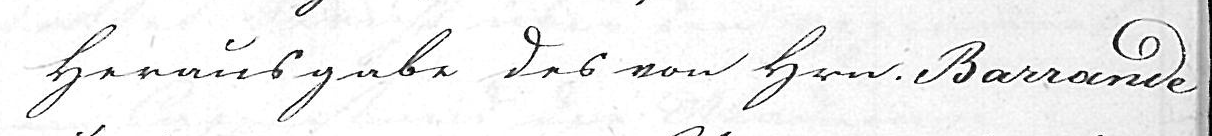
Herausgabe des von Hrn. Barrande
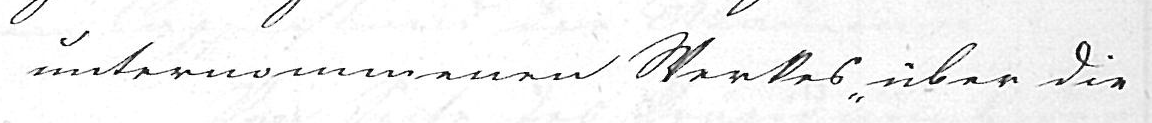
unternommenen Werkes "Über die
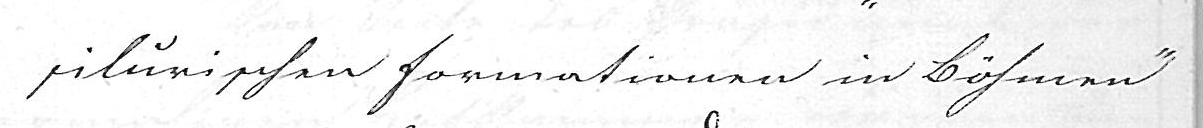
silurischen Formationen in Böhmen"
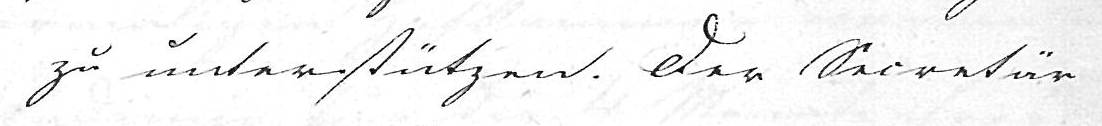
zu unterstützen. Der Secretär
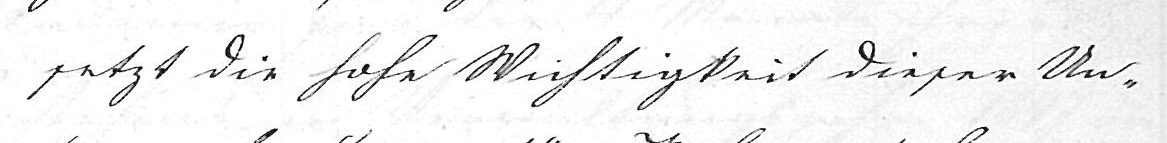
setzt die hohe Wichtigkeit dieser Un-
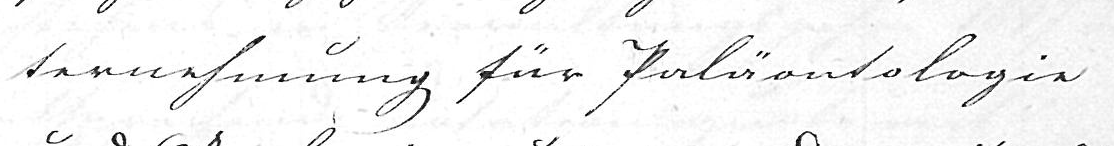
ternehmung für Paläontologie
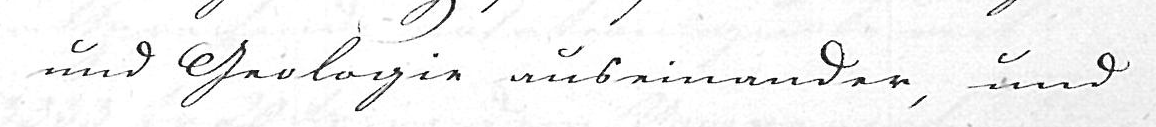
und Geologie auseinander, und
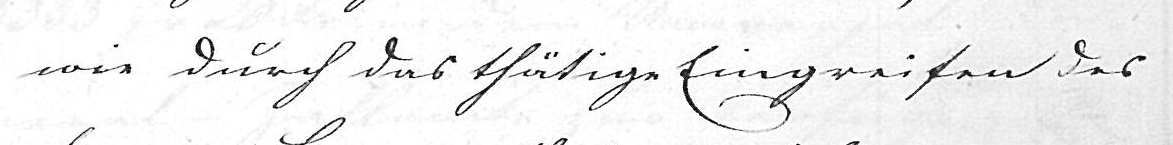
wie durch das thätige Eingreifen des
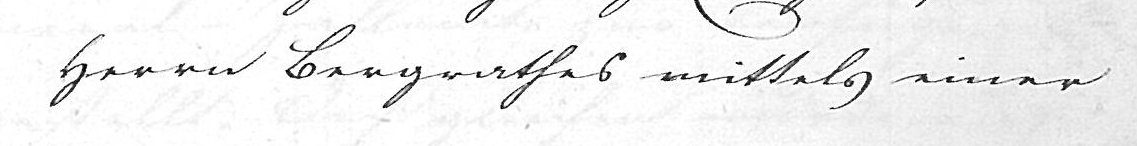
Herrn Bergrathes mittels einer
